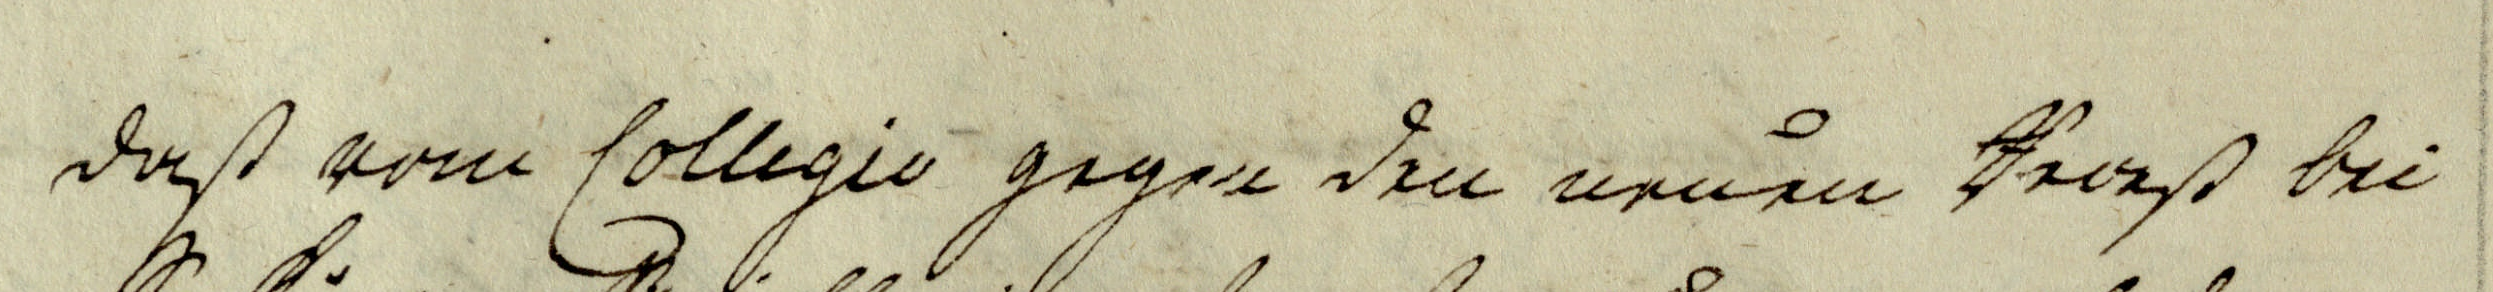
daß vom Collegio gegen den neuen Receß bei
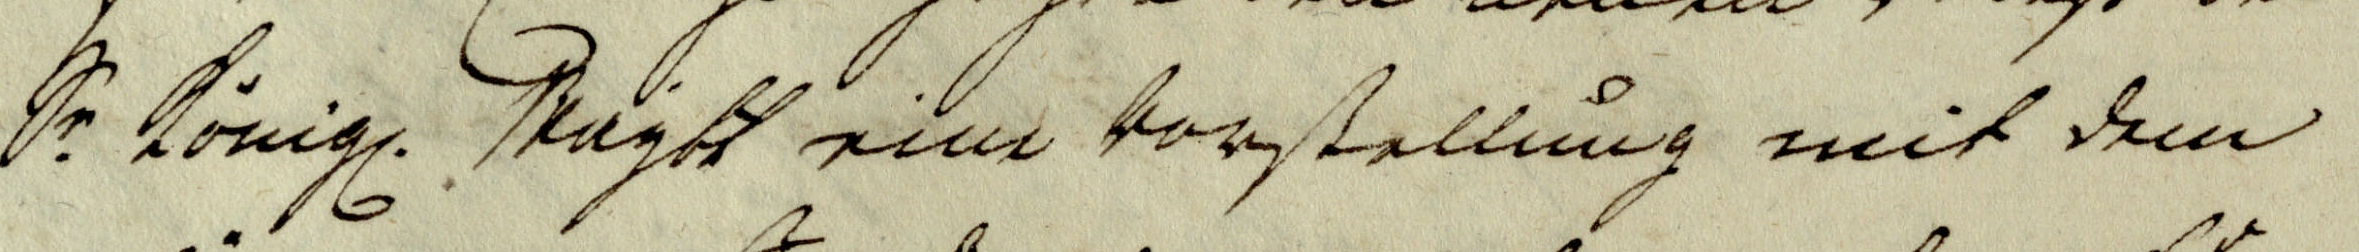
Sr Königl. Maÿtt eine Vorstellung mit dem
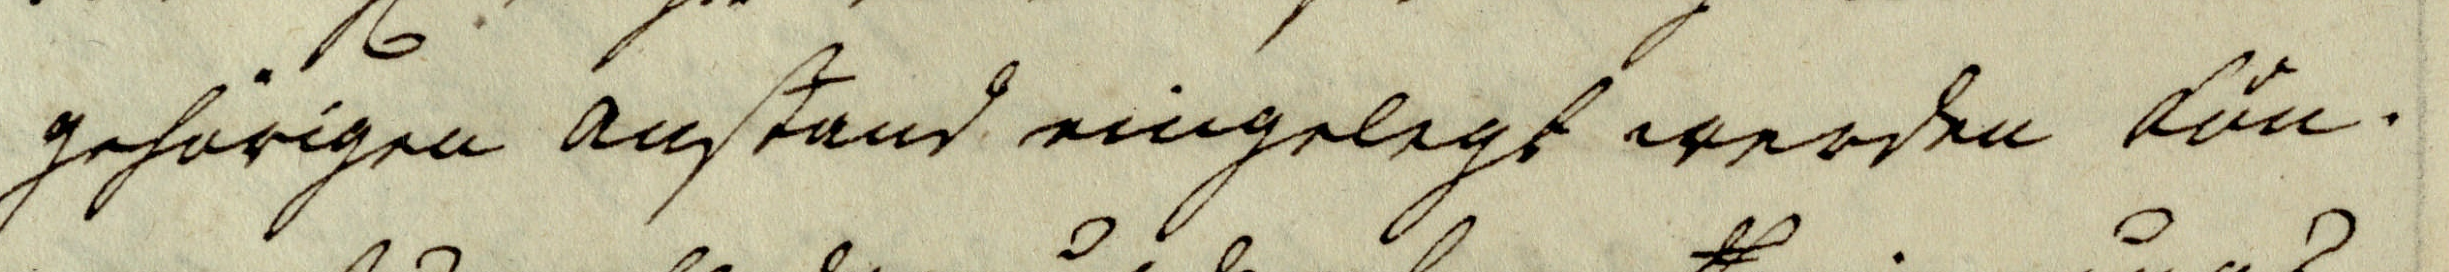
gehörigen Anstand eingelegt werden kön¬
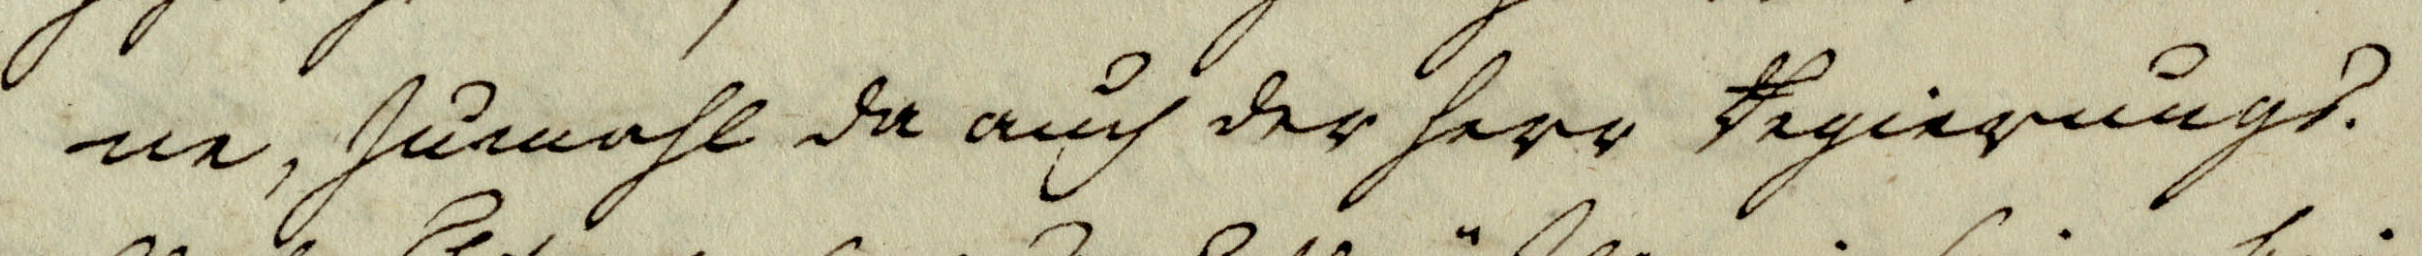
ne, zumahl da auch der Herr Regierungs-
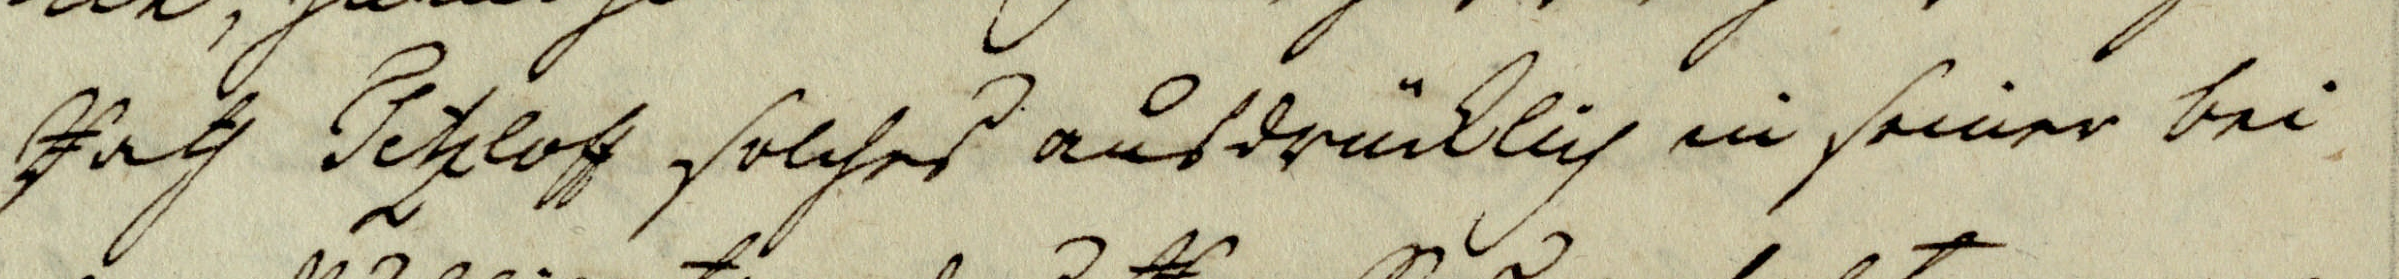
Rath Tetzloff solches ausdrücklich in seiner bei
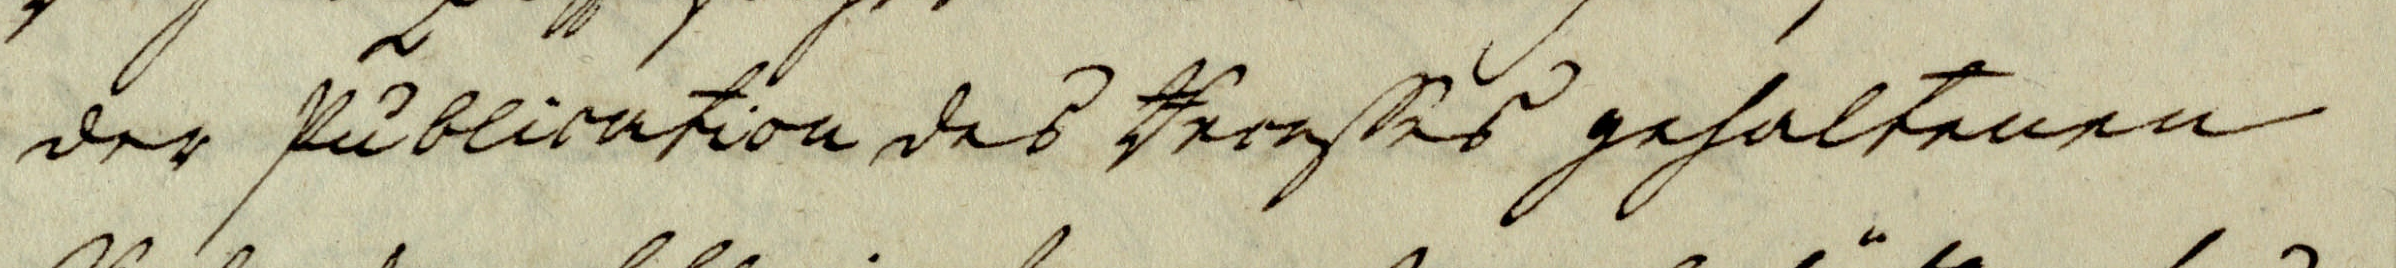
der Publication des Recesses gehaltenen
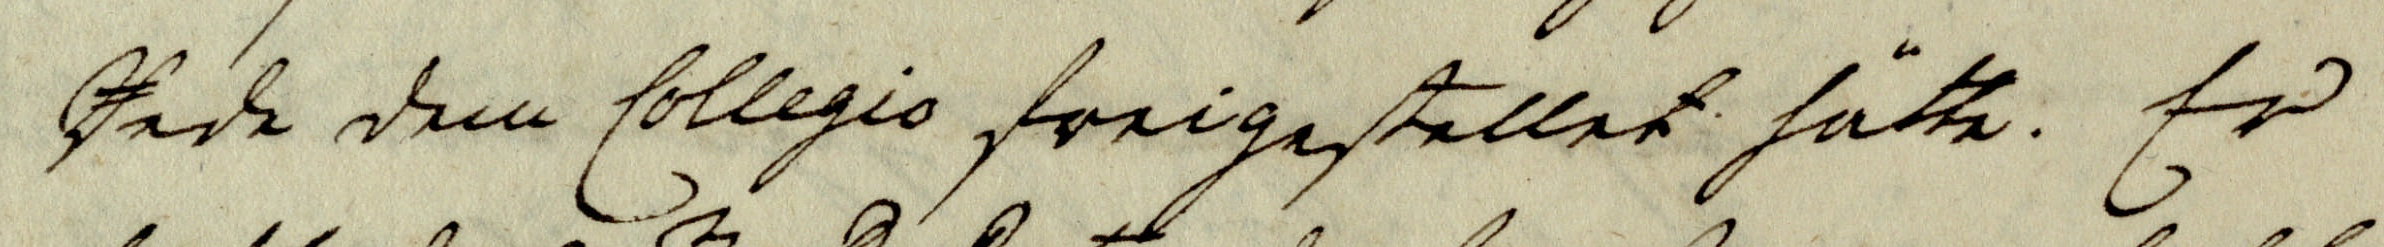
Rede dem Collegio freigestellet hätte. Er
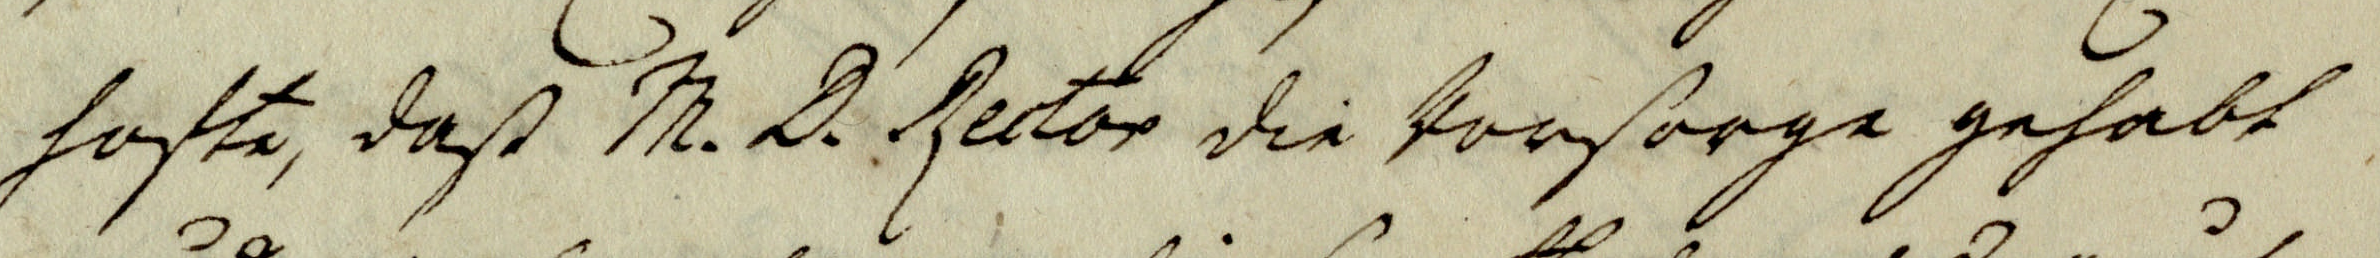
hofte, daß M. D. Rector die Vorsorge gehabt
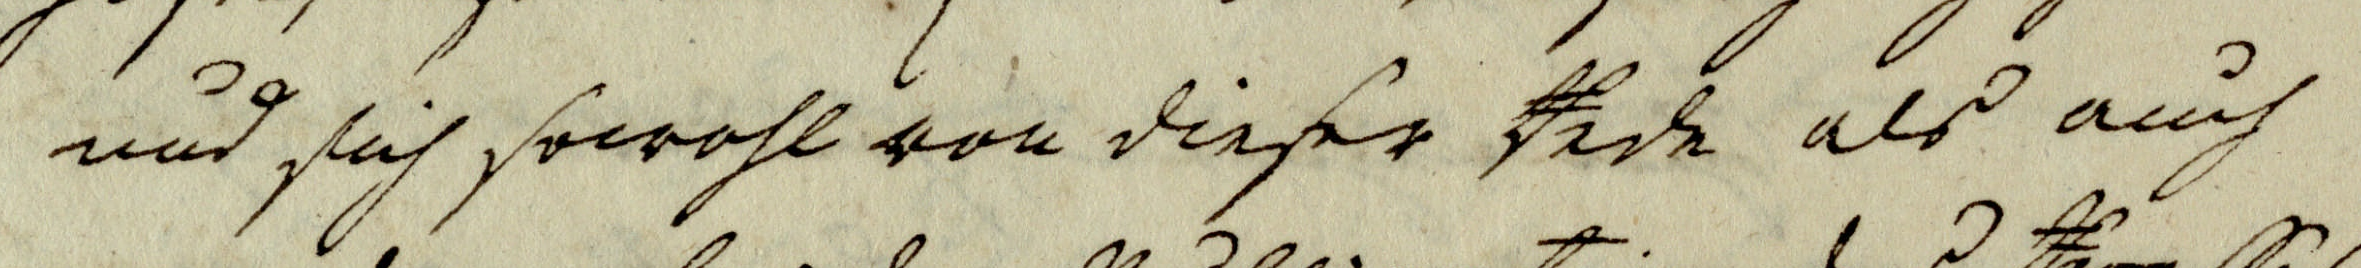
und sich sowohl von dieser Rede als auch
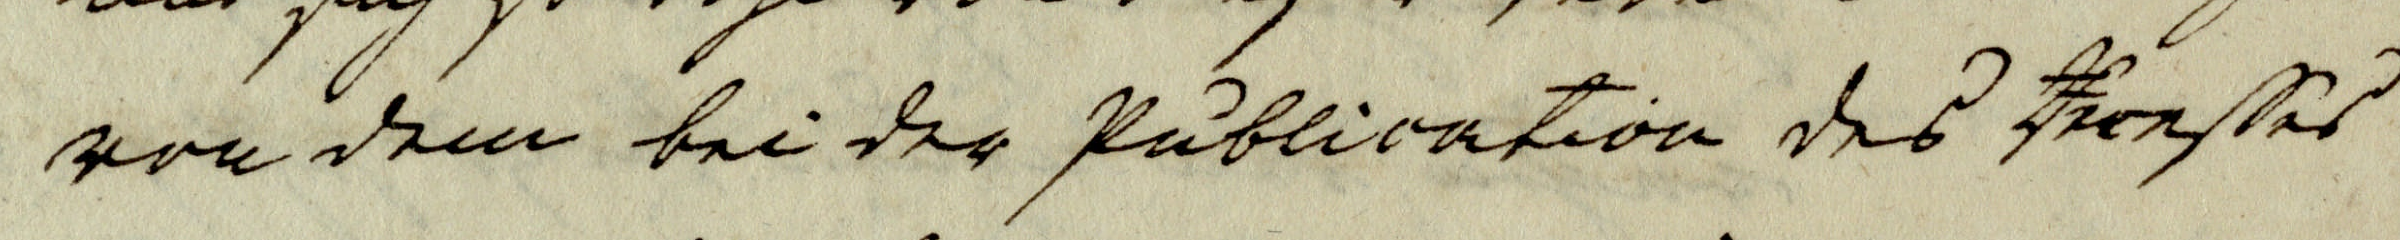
von dem bei der Publication des Recesses
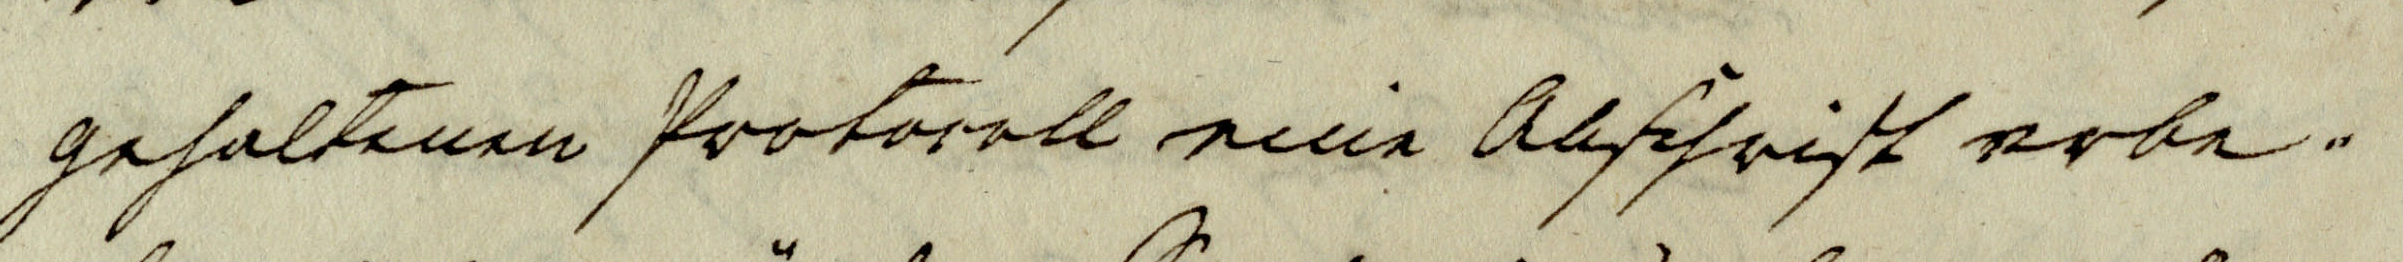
gehaltenen Protocoll eine Abschrift erbe¬
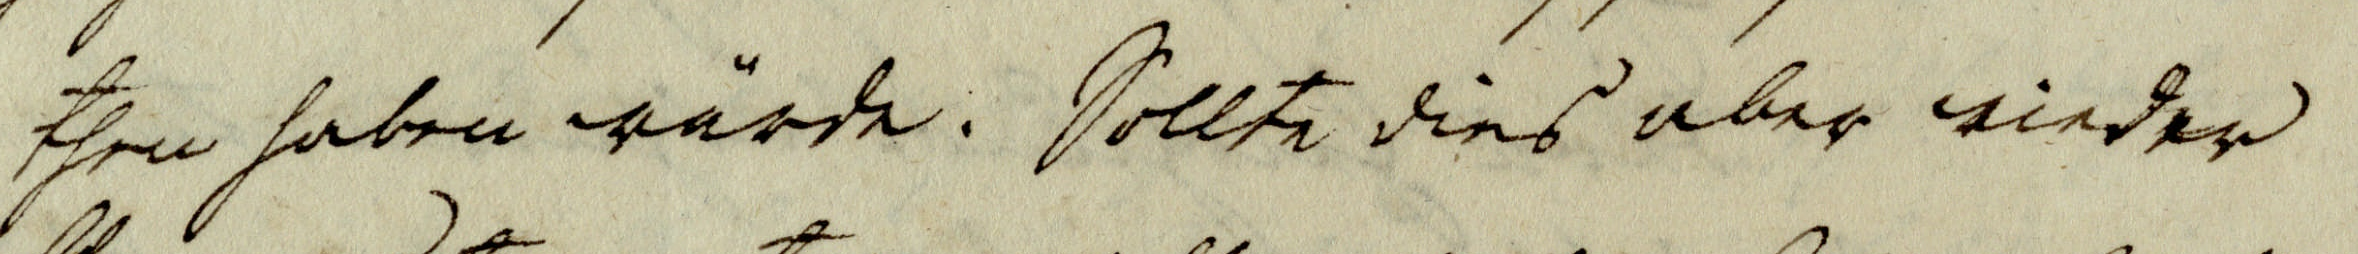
then haben würde. Sollte dies aber wieder
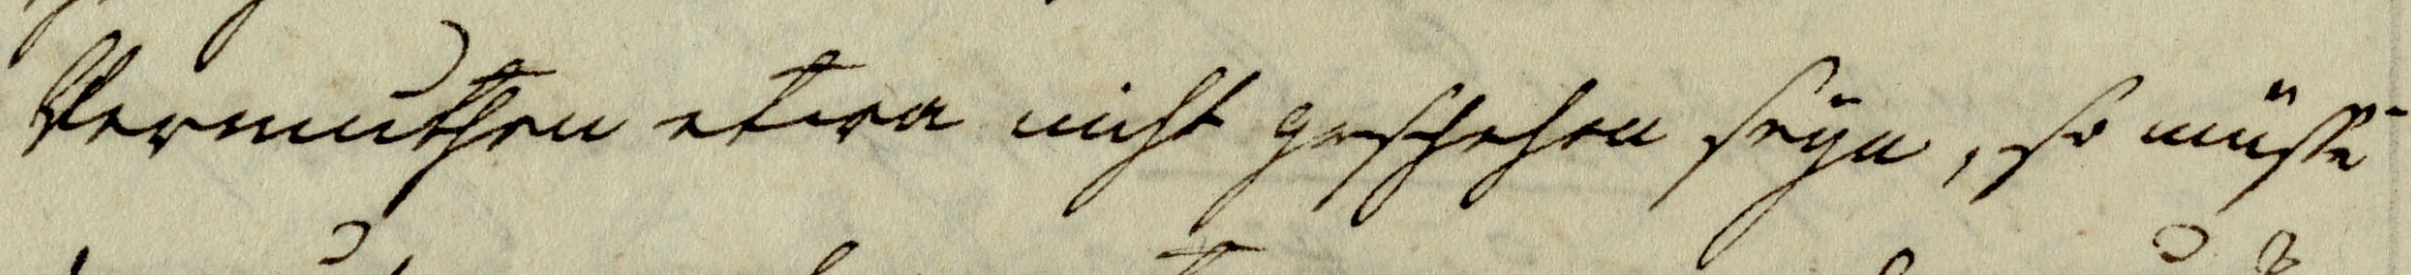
Vermuthen etwa nicht geschehen seÿn, so müsse
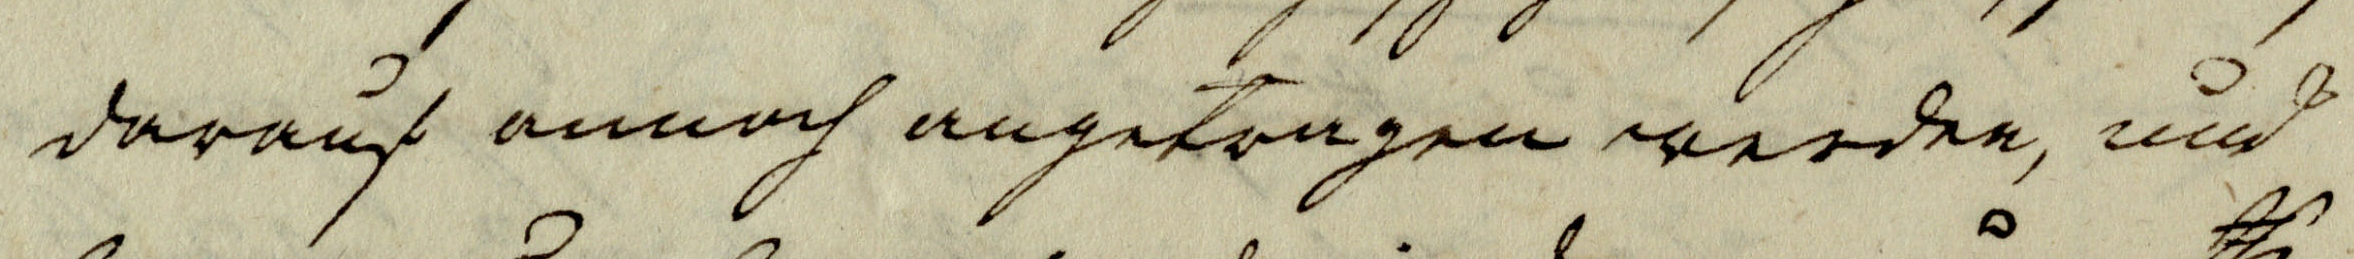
darauf annoch angetragen werden, und
